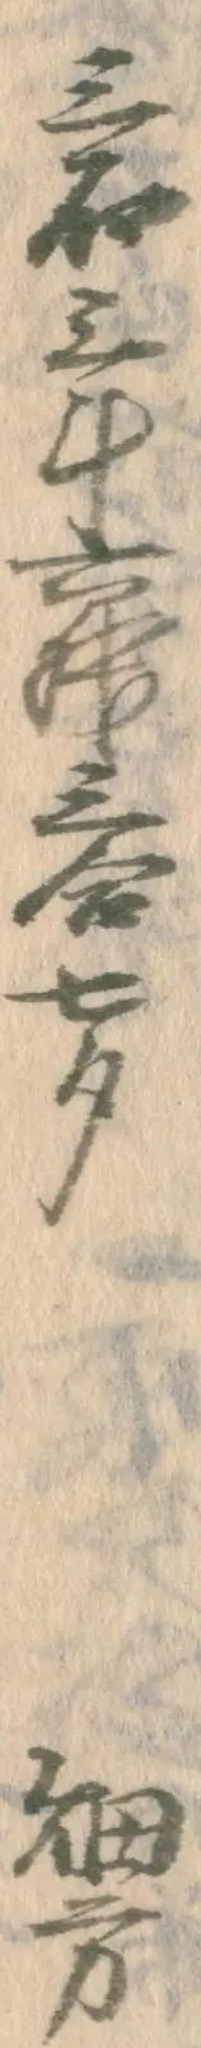三石三斗六升三合七夕畑方
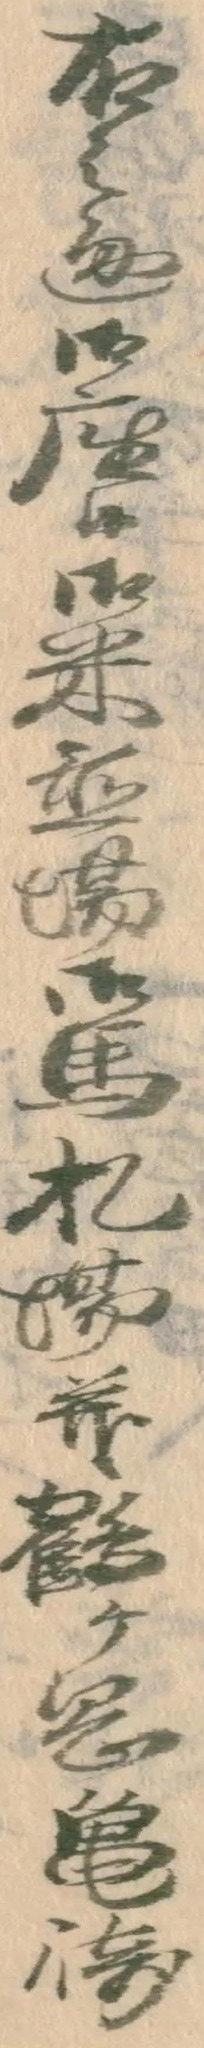右之通御座候御米置場御馬札場并鶴ケ丘亀崎
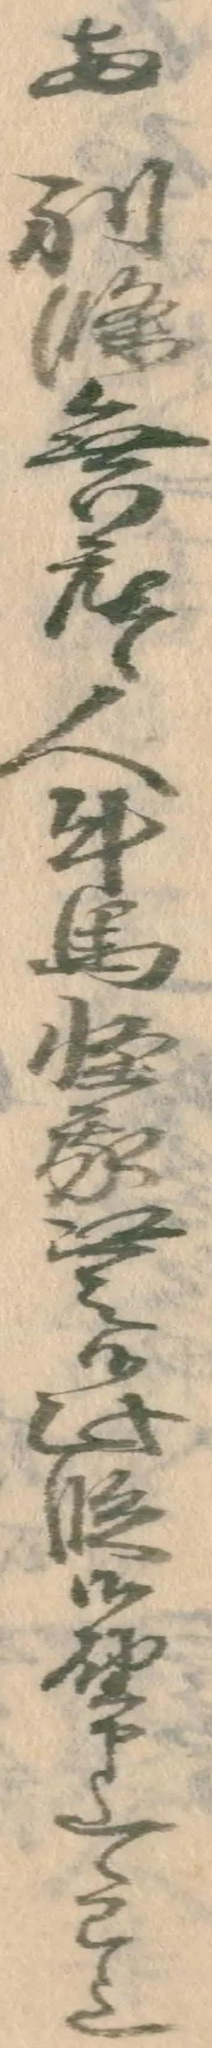両別条無御座候人牛馬怪我無之候此段御届申上候已上
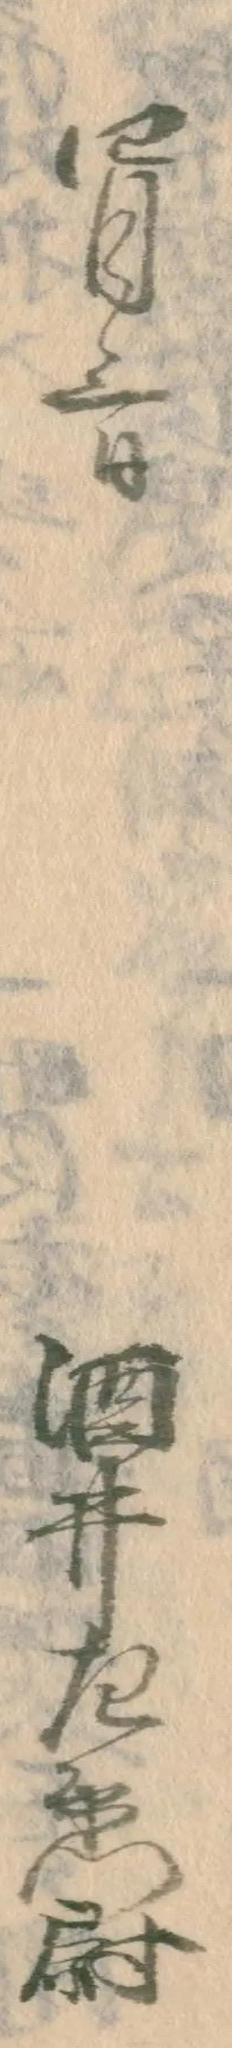四月三日酒井左衛門尉
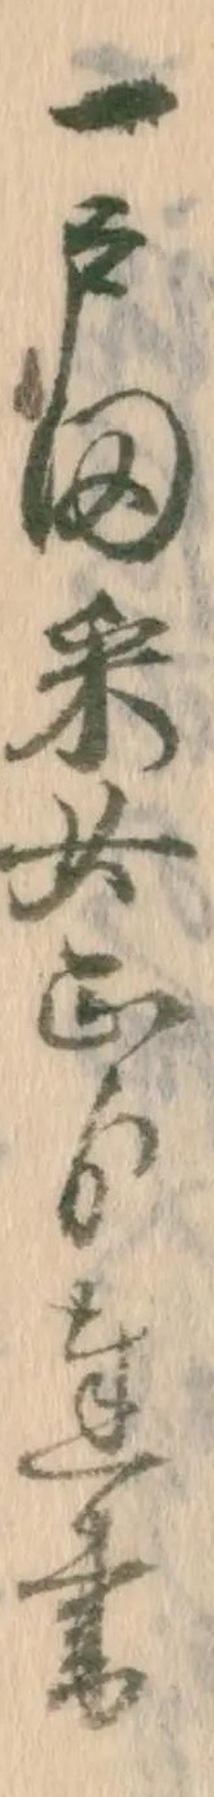一戸田采女正ゟ達書
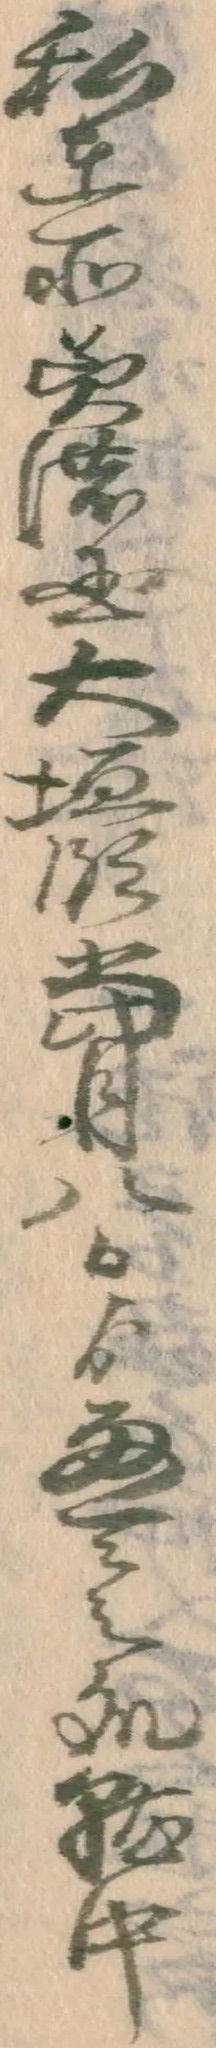私在所美濃国大垣領当月八日ゟ雨天之処就中
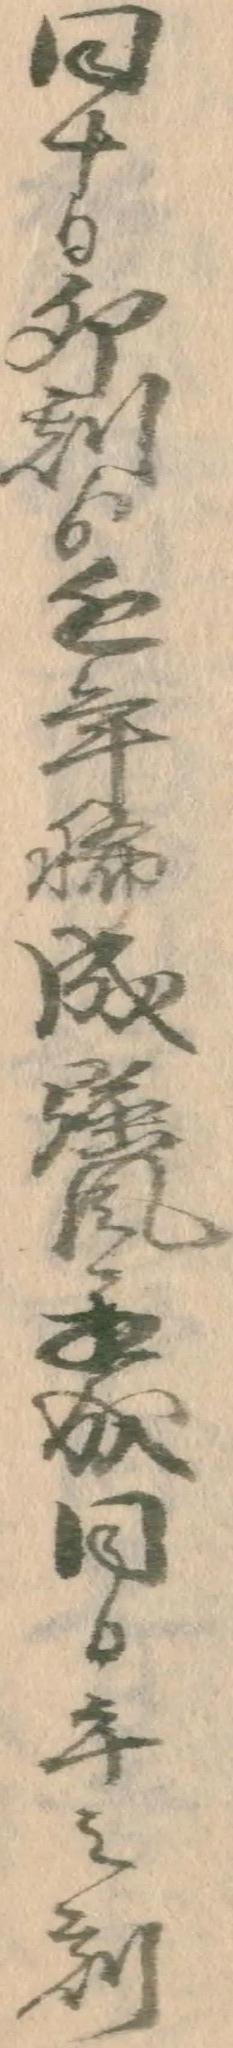同十日卯刻ゟ近年稀成強風重成同日午之刻
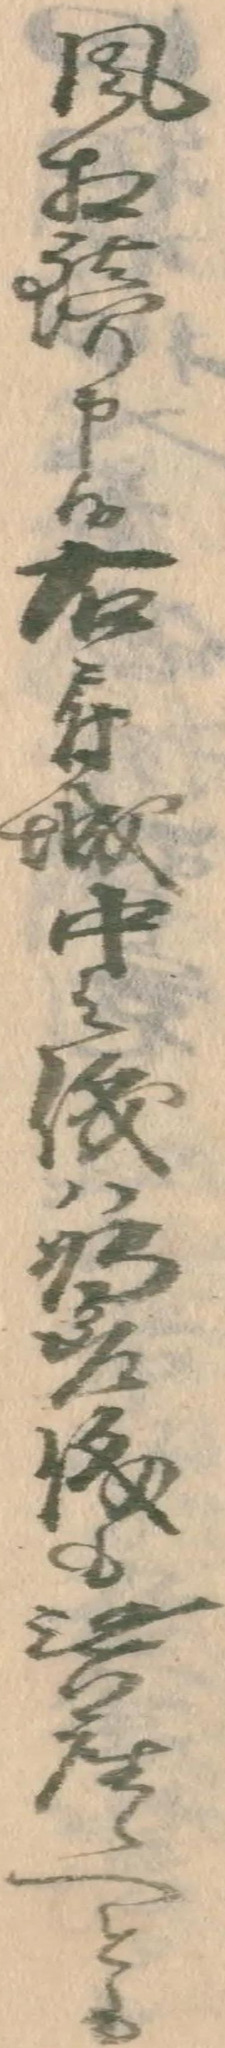風相鎮り申候右二付城中之儀ハ為差儀も無御座候へとも
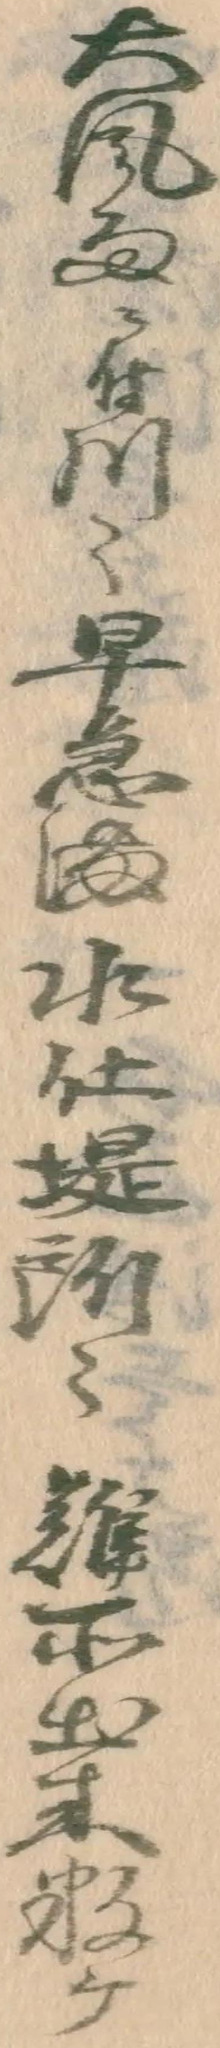おお風雨二付川々早急満水仕堤所々難所出来数ヶ
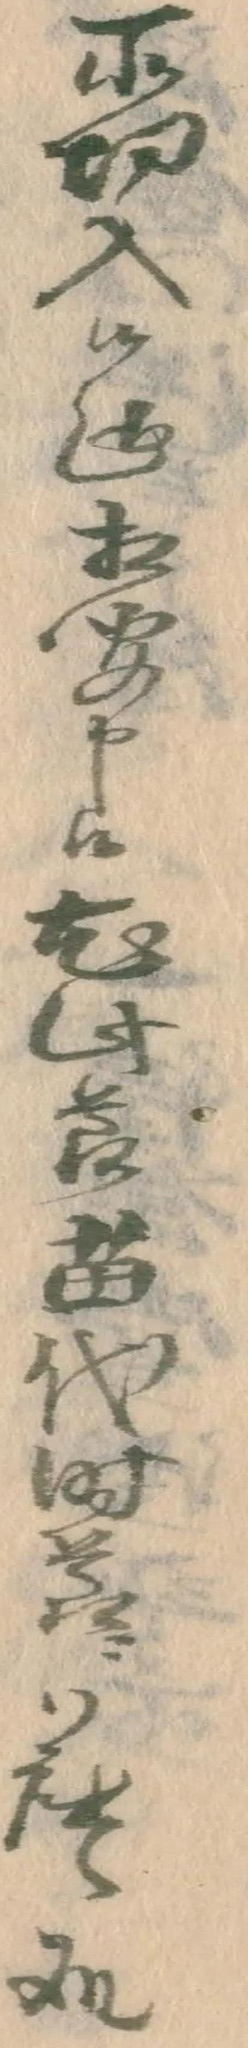所切入候趣相聞申候尤此節苗代時節二御座候処
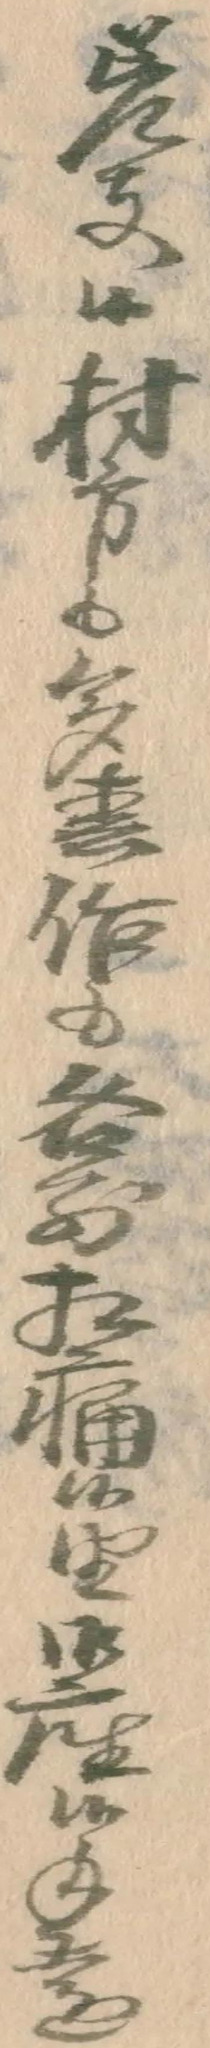差支候村方も多麦作も格別相痛候由御座候手遠
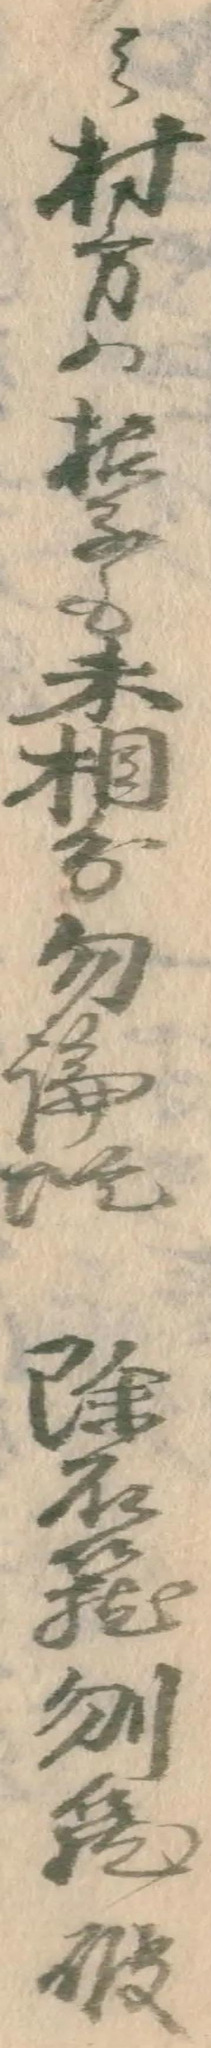之村方ハ様子も未相分勿論堤除石籠刎籠破
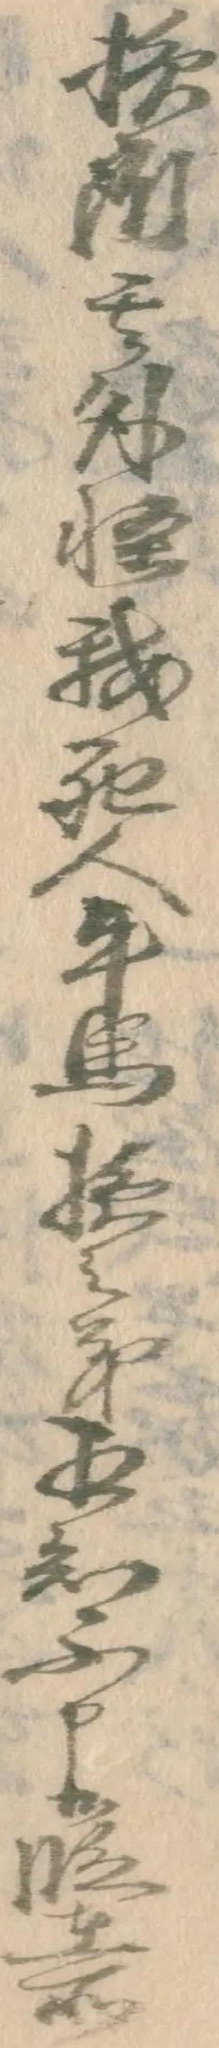損所其外怪我死人牛馬損之事相知不申候段在所
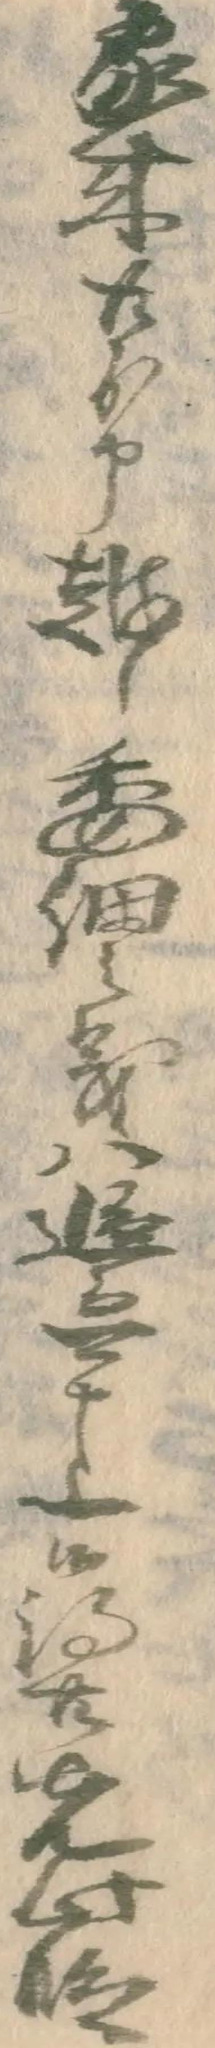家来共ゟ申越候委細之義ハ追而可申上候得共先此段
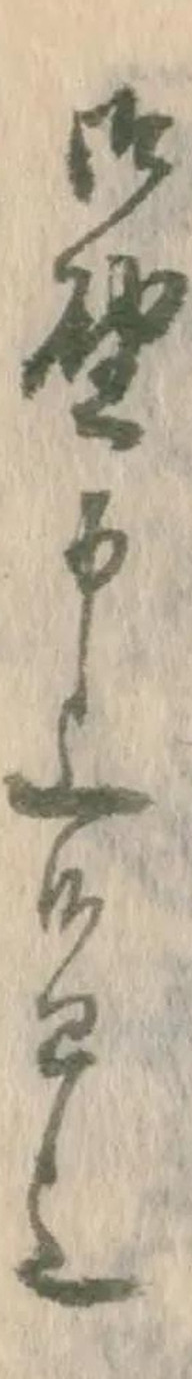御届申上候已上
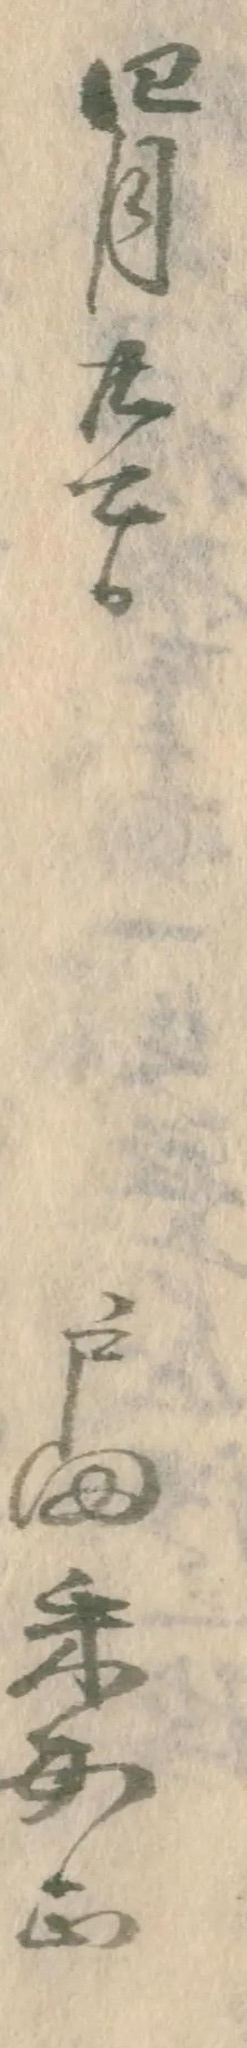四月廿廿七日戸田采女正
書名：信州大地震之記
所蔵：国立国会図書館 National Diet Library, JAPAN
